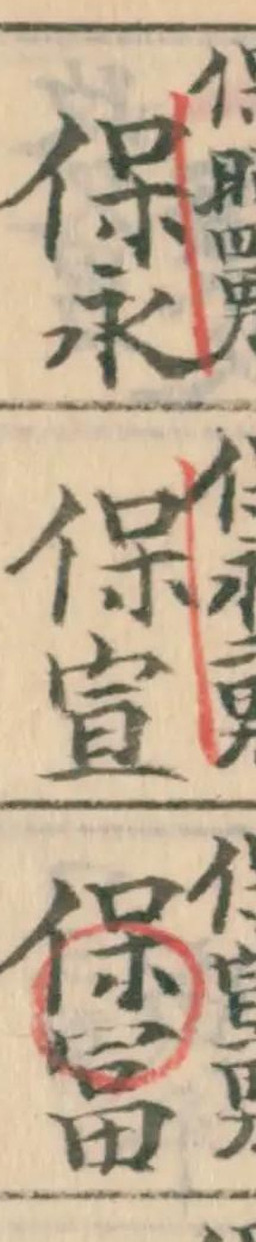保永保宣保冨
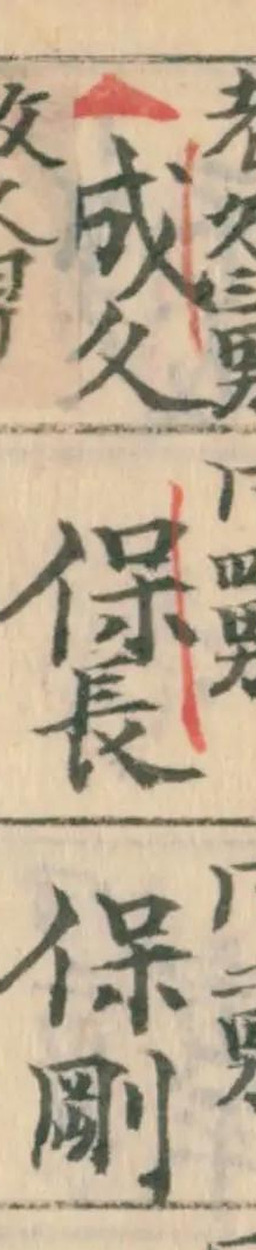▲成久保長保剛

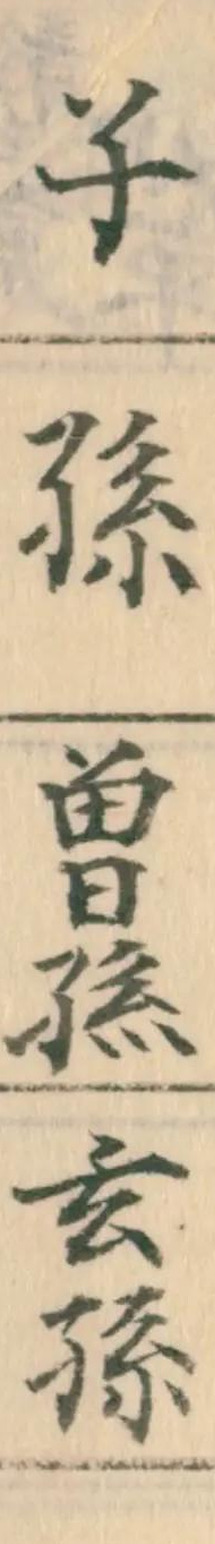子孫曽孫玄孫
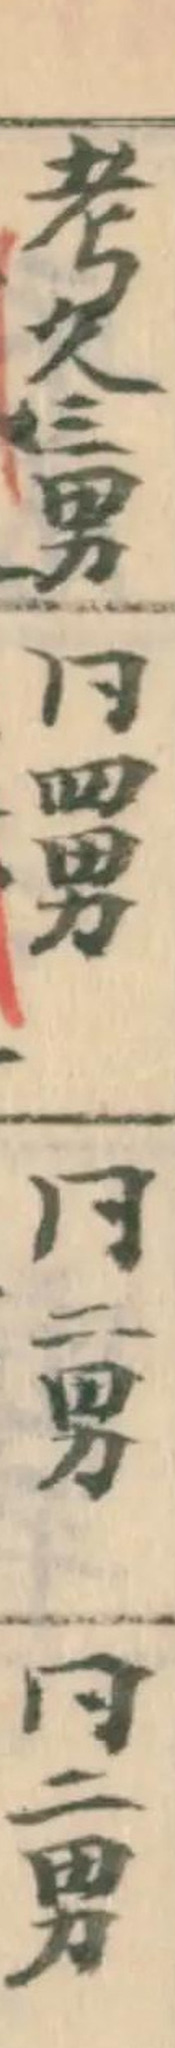考久三男同四男同二男同二男
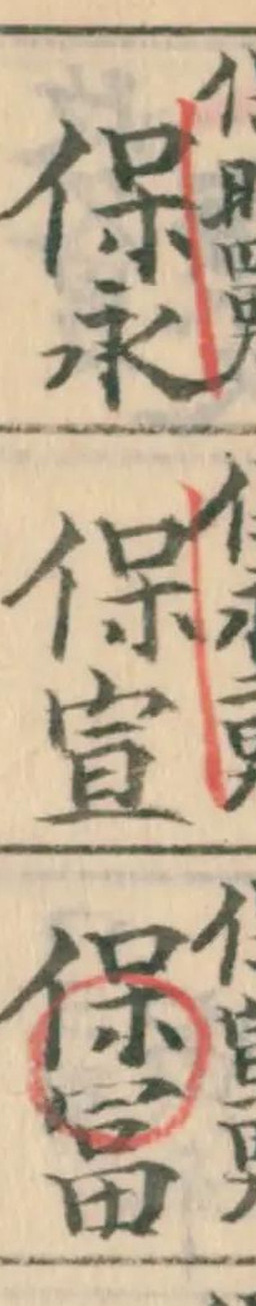保永保宣保冨
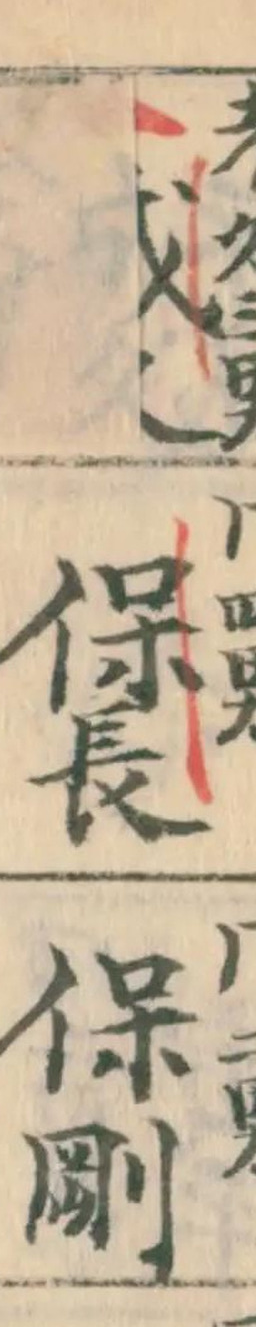保長保剛
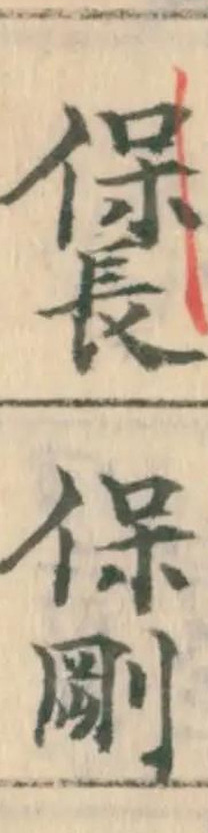保長保剛

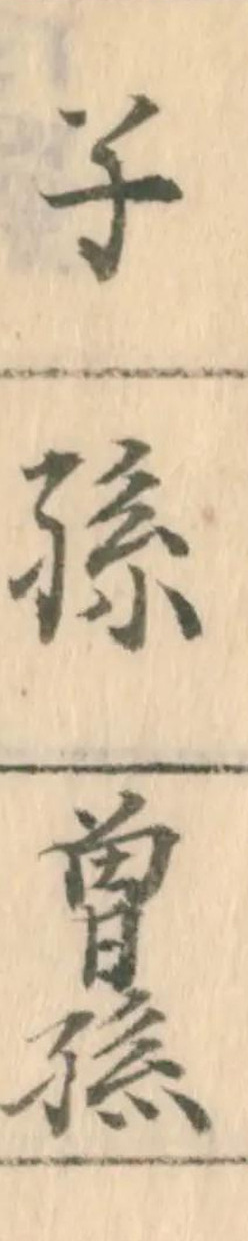子孫曽孫
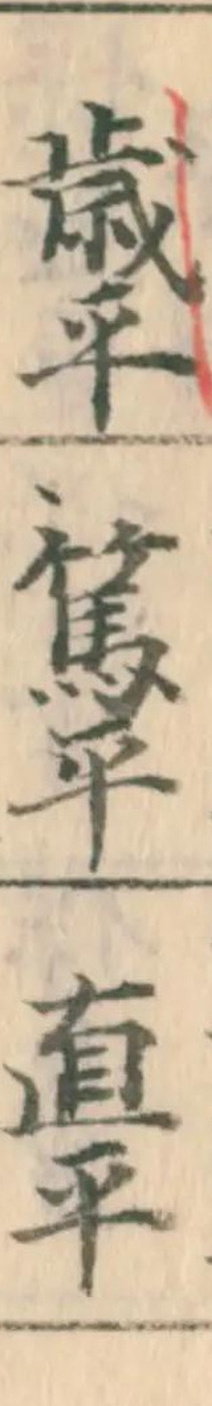歳平篤平直平
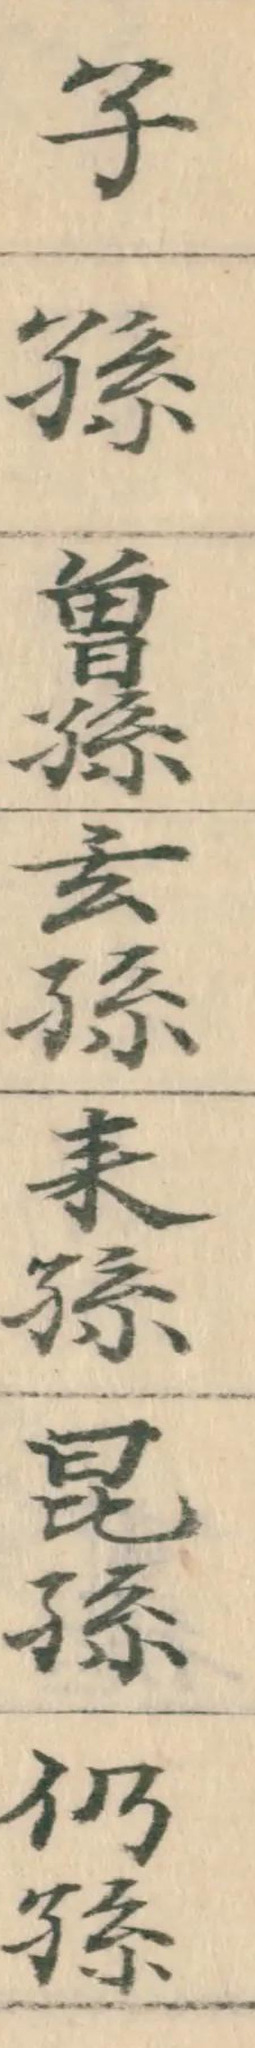子孫曽孫玄孫来孫昆孫仍孫
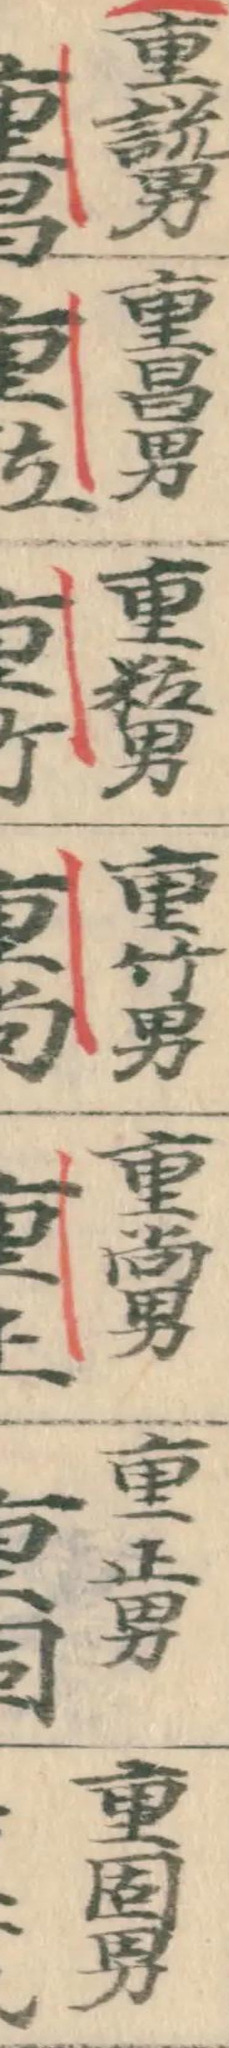▲重説男重昌男重粒男重竹男重尚男重正男重固男
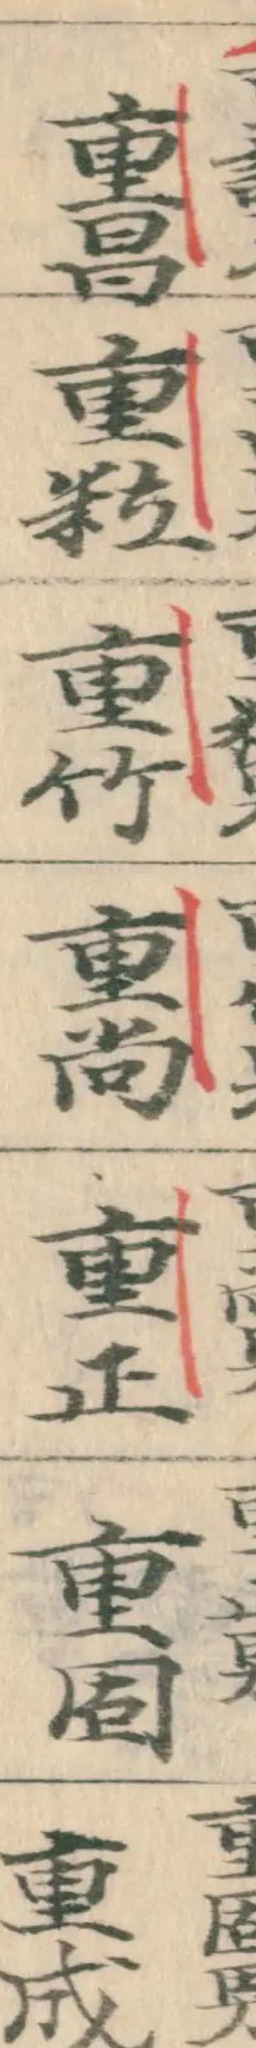重昌重粒重竹重尚重正重固重成
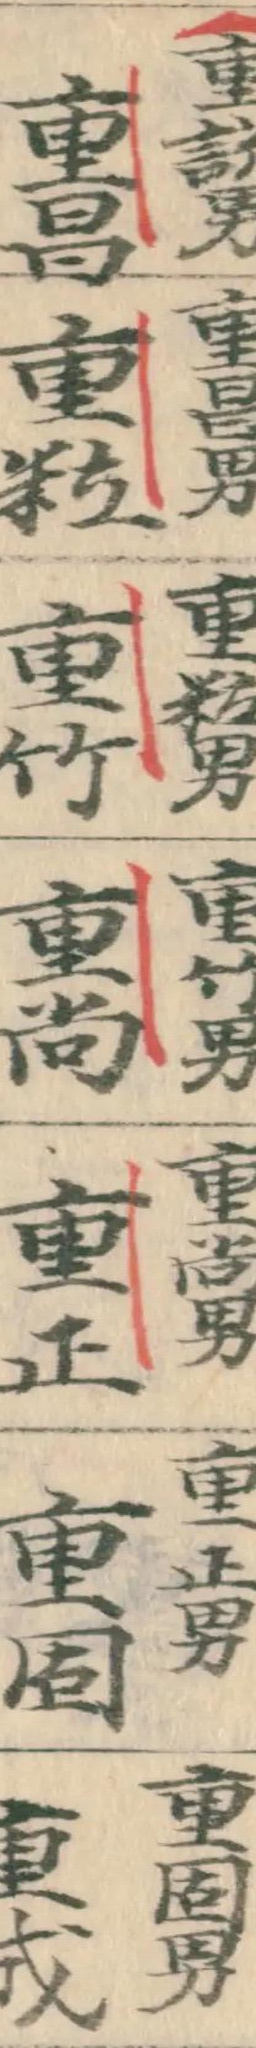重昌重粒重竹重尚重正重固重成
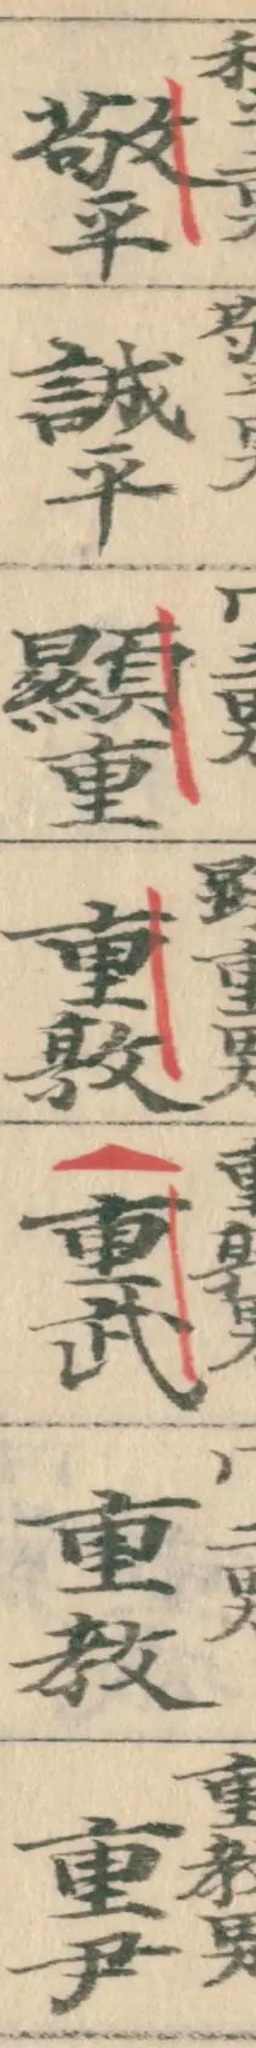敬平誠平顕重重敦▲重武重教重尹

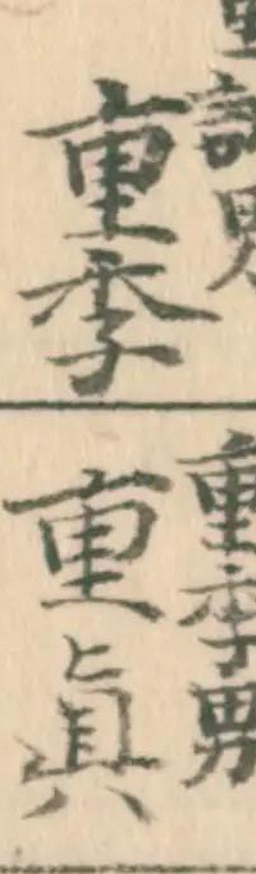重季重眞
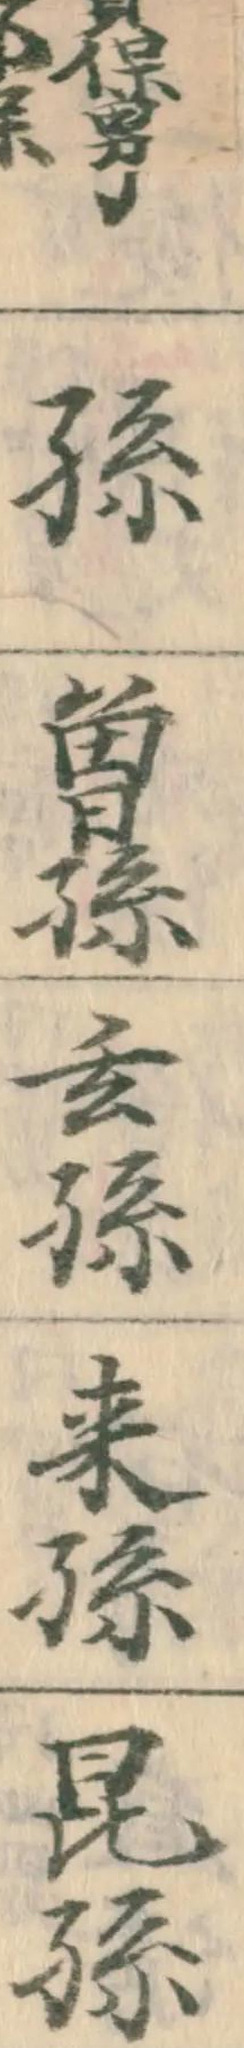孫曽孫玄孫来孫昆孫
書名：賀茂社記録. 第24冊
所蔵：国立国会図書館 National Diet Library, JAPAN
